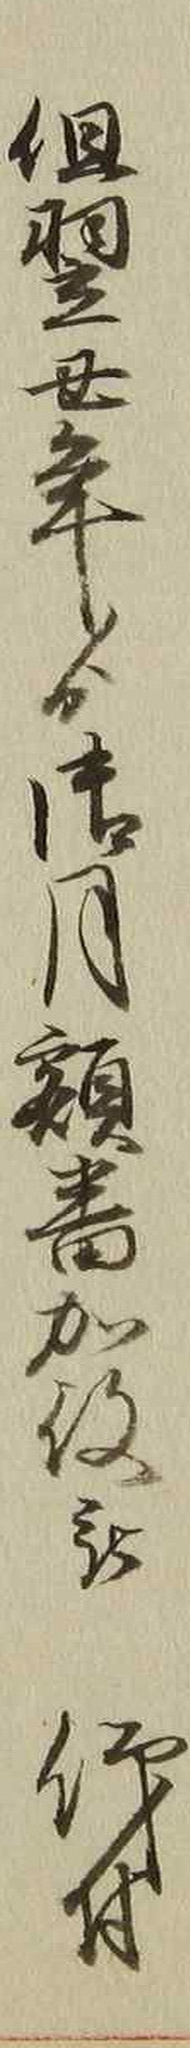但翌丑年ゟ御月額番加役被仰付
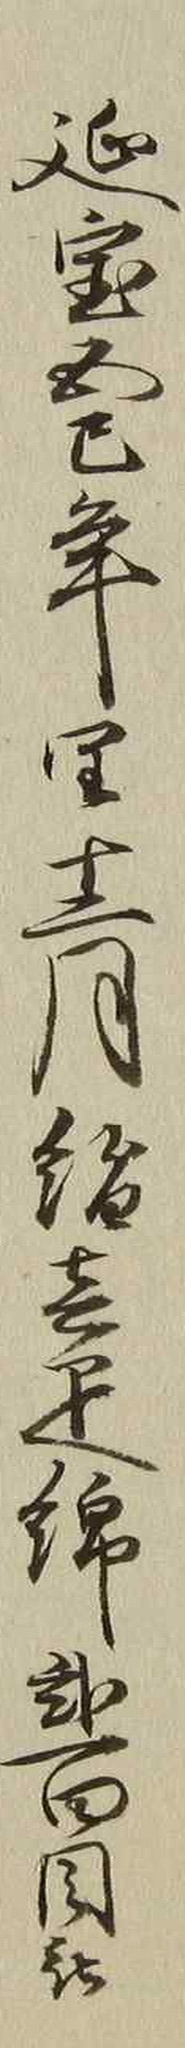一延宝五巳年閏十二月絹壱疋綿弐百目被
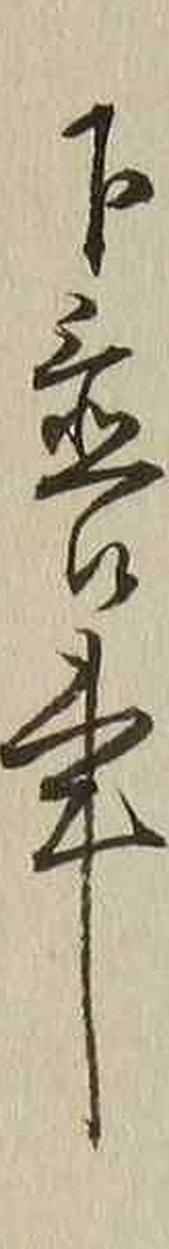下置候事
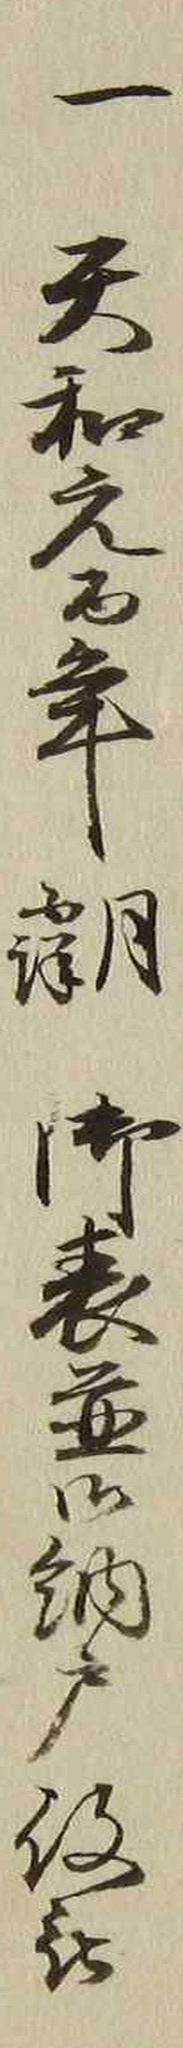一天和元酉年月ふ詳御表並御納戸役被
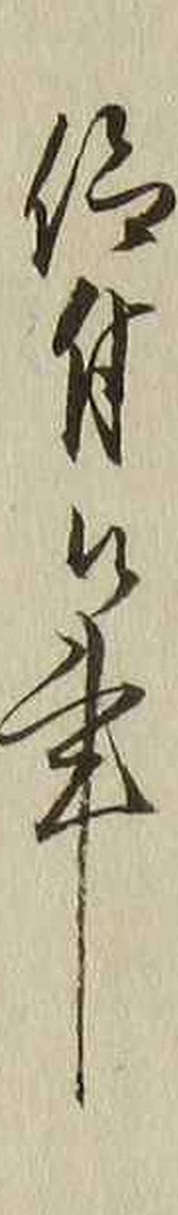仰付候事
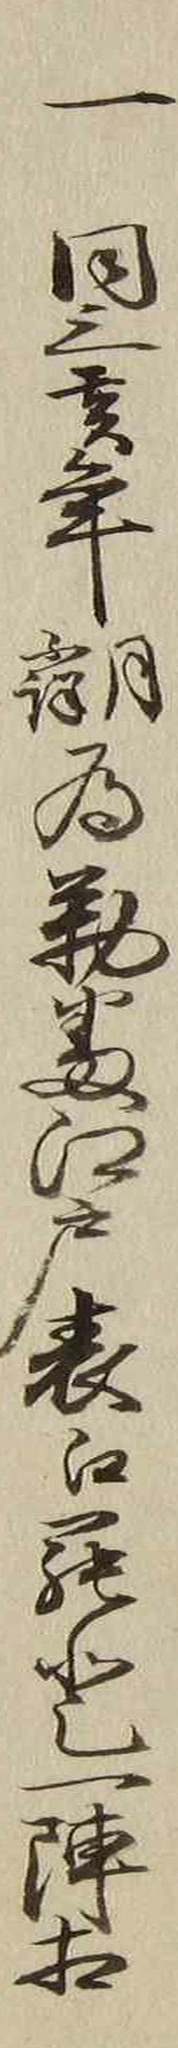一同三亥年月ふ詳為金番江戸表江罷登一陣相
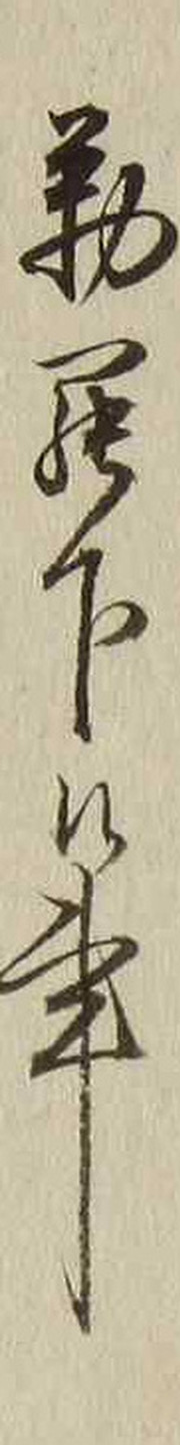勤罷下候事
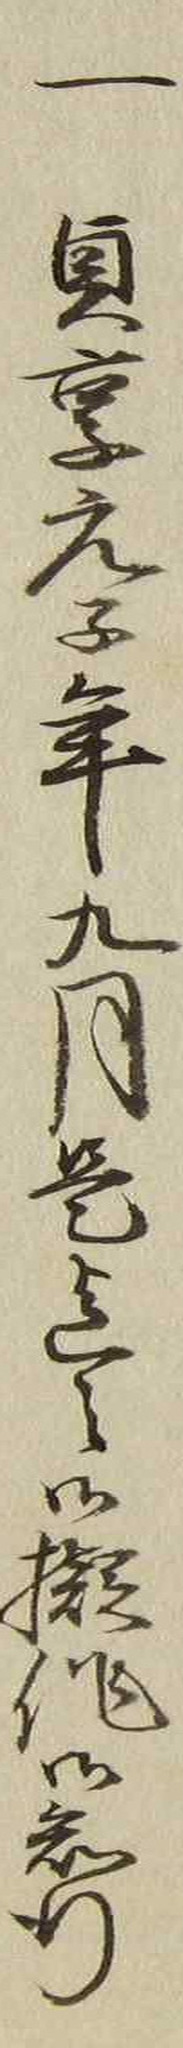一貞享元子年九月是迄之御擬作御知行
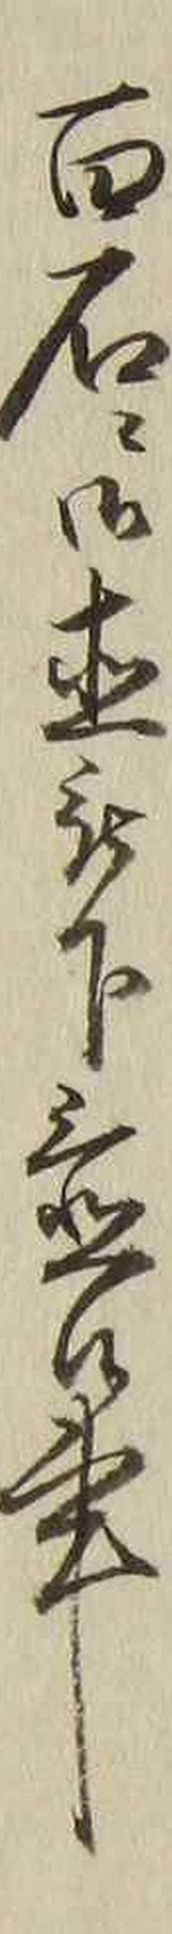百石二御直被下置候事
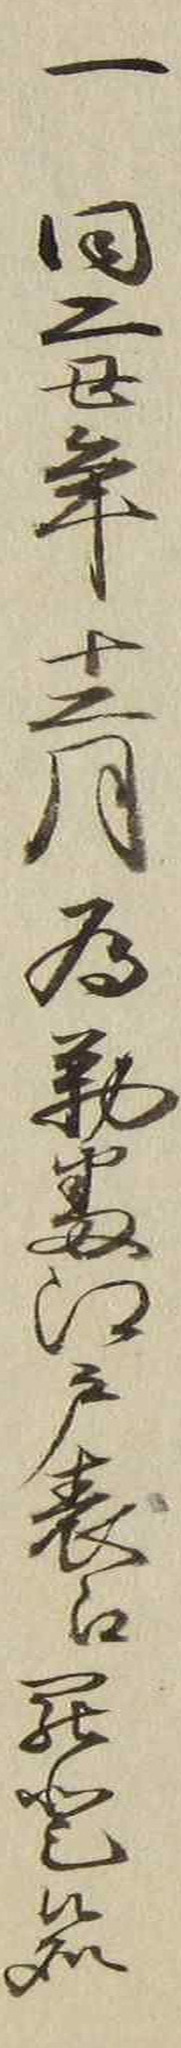一同ニ丑年十二月為勤番江戸表江罷登候処
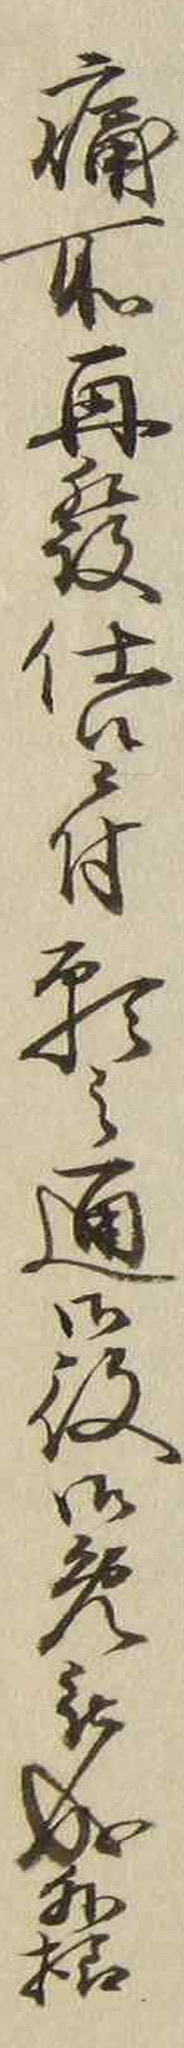痛所再発仕候ニ付願之通御役御免被成外様

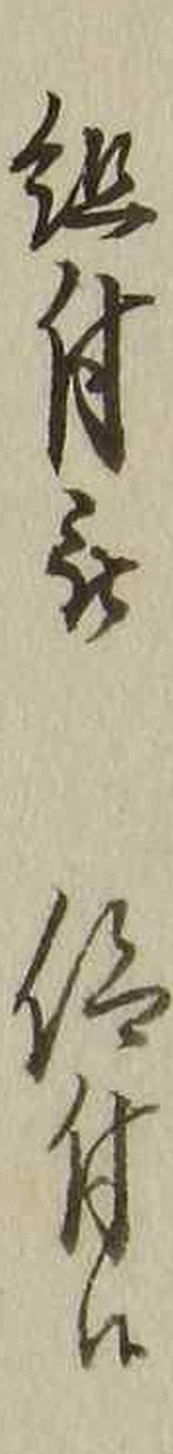組付被仰付候
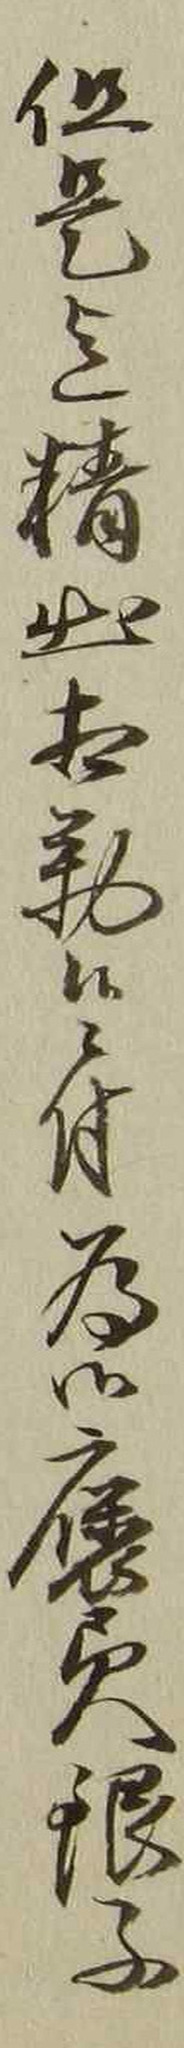但是迄精出相勤候ニ付為御褒美銀子
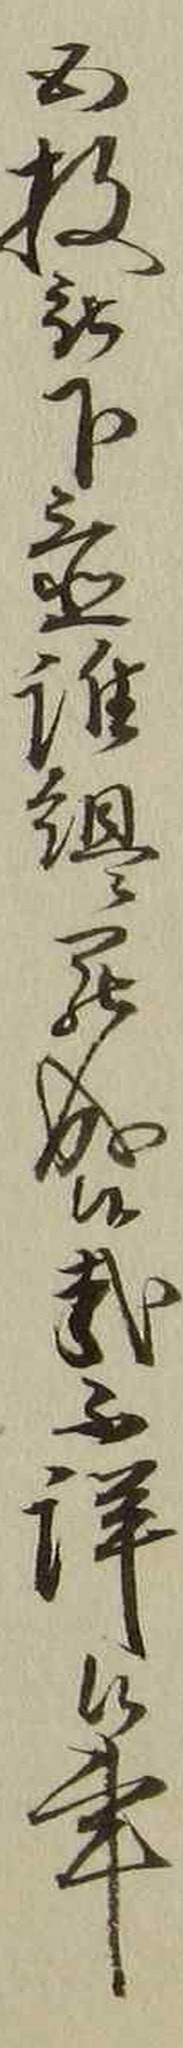五枚被下置誰組ニ罷成候哉ふ詳候事
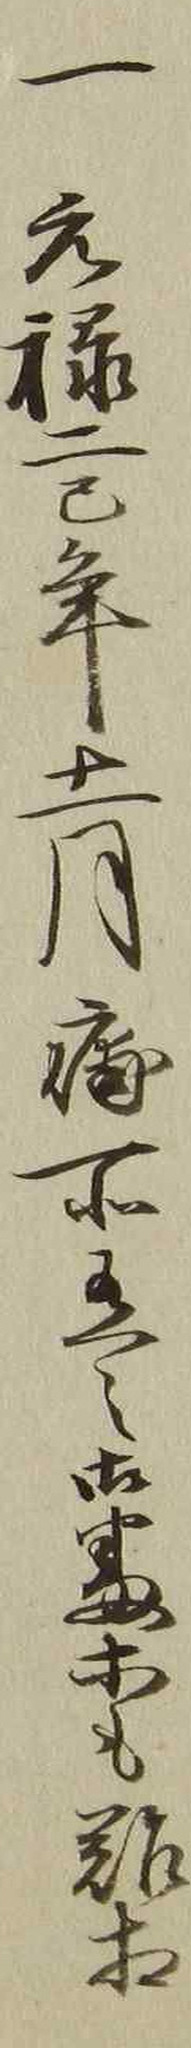一元禄二巳年十一月痛所有之御番等も難相
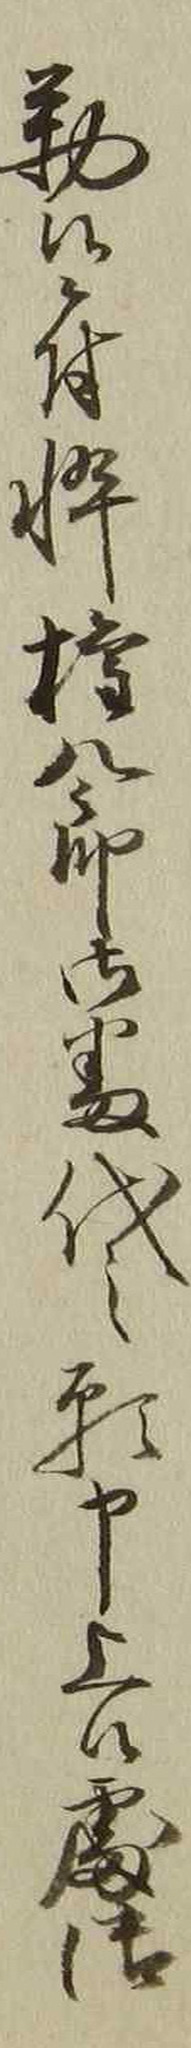勤候ニ付忰権八郎御番代之願申上候處御
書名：諸士系譜　巻之114　か之部22
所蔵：会津若松市立会津図書館
